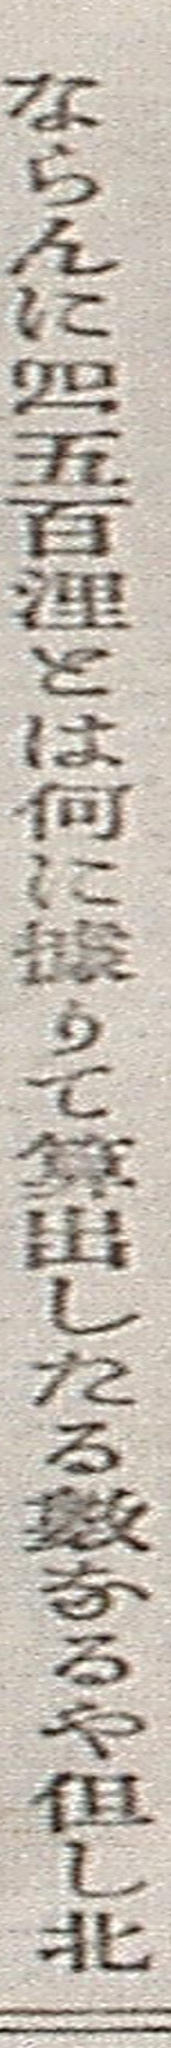ならんに四五百浬とは何に拠りて算出したる数なるや但し北
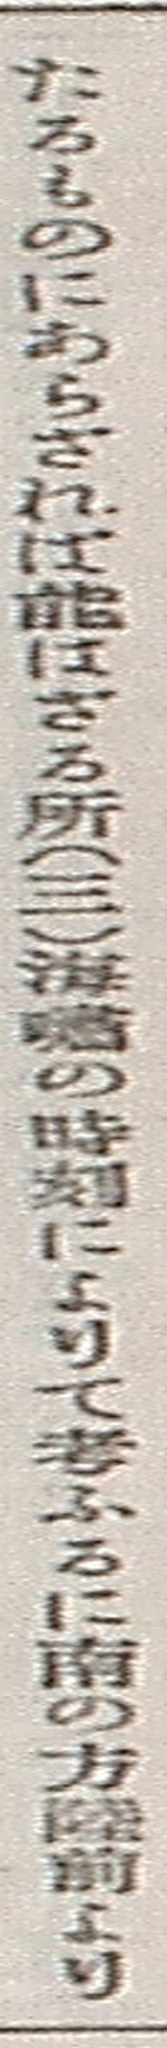たるものにあらざれば能はざる所海嘯の時刻によりて考ふるに南の方陸前より
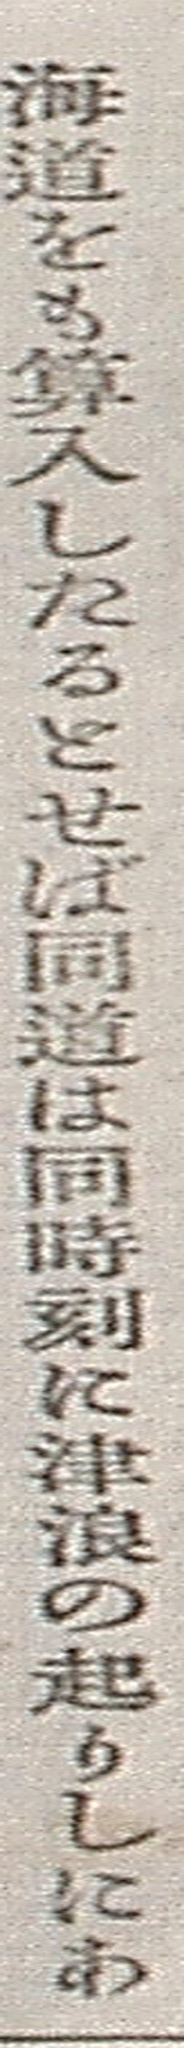海道をも算入したるとせば同道は同時刻に津浪の起りしにあ
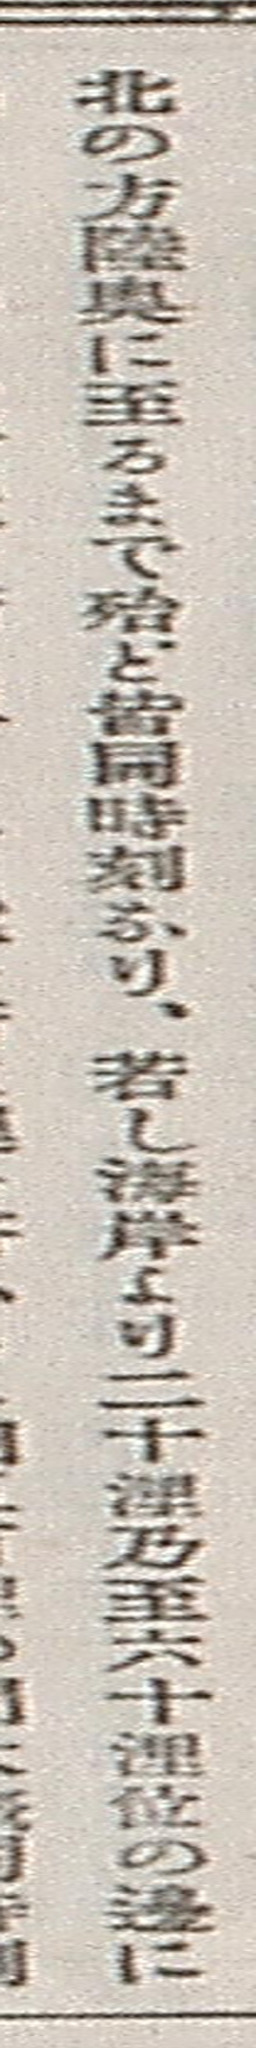北の方陸奥に至るまで殆ど皆同時刻なり、若し海岸より二十浬乃至六十浬位の辺に
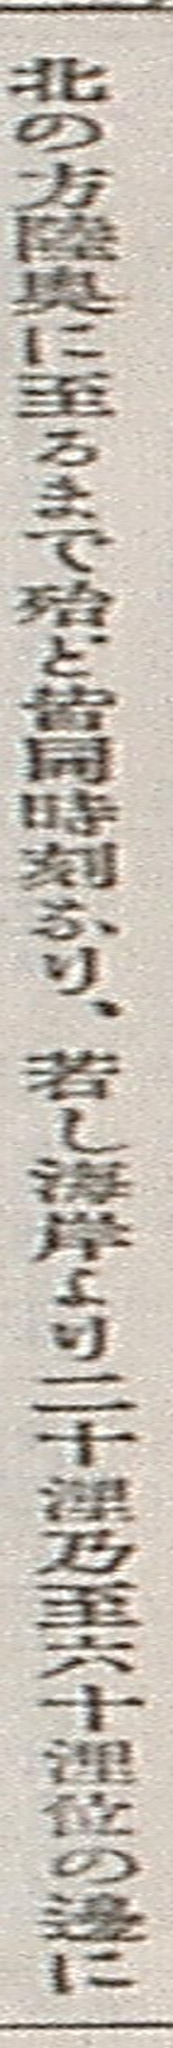北の方陸奥に至るまで殆ど皆同時刻なり、若し海岸より二十浬乃至六十浬位の辺に
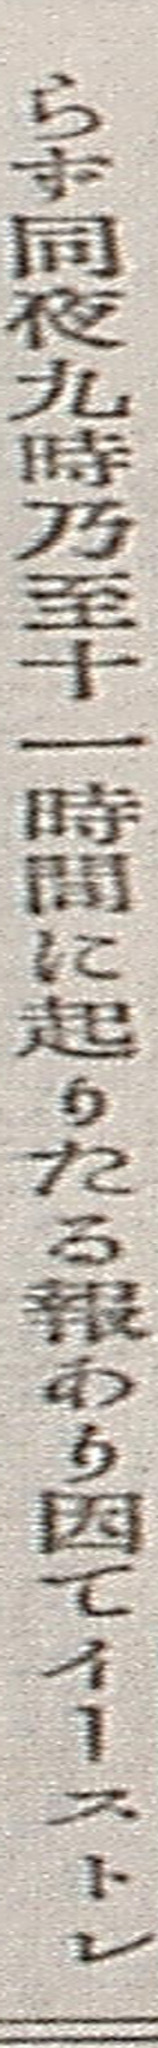らず同夜九時乃至十一時間に起りたる報あり因てイーストレ
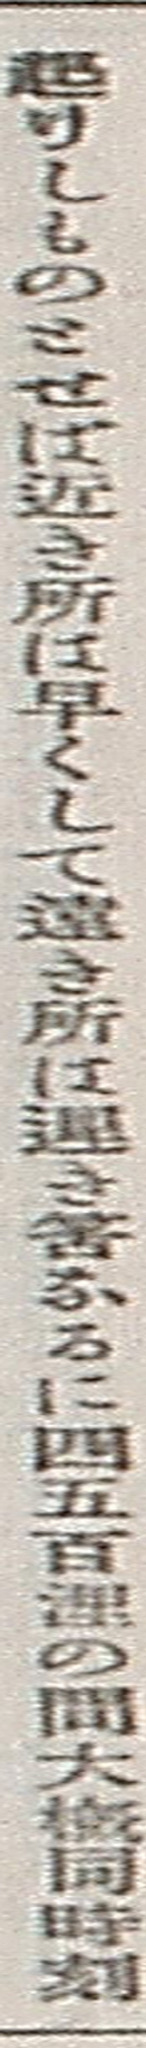起りしものとせば近き所は早くして遠き所は遅き筈なるに四五百浬の間大概同時刻
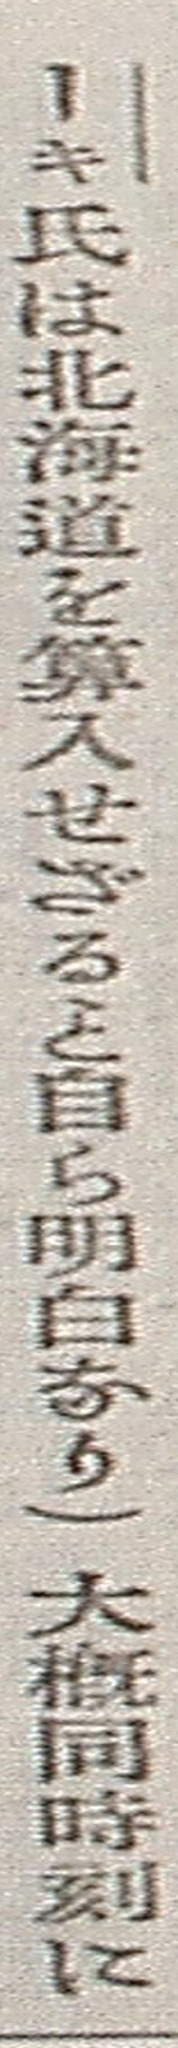ーキ氏は北海道を算入せざること自ら明白なり）大概同時刻に
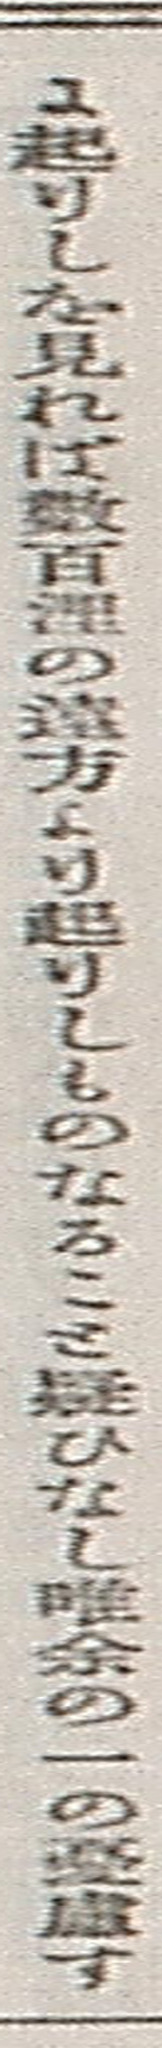に起りしを見れば数百浬の遠方より起りしものなること疑ひなし唯余の一の憂慮す
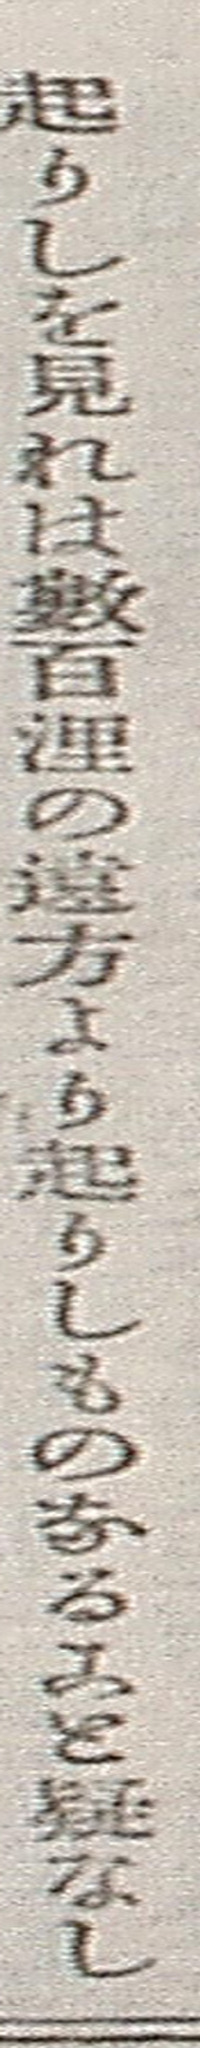起りしを見れは数百浬の遠方より起りしものなること疑なし
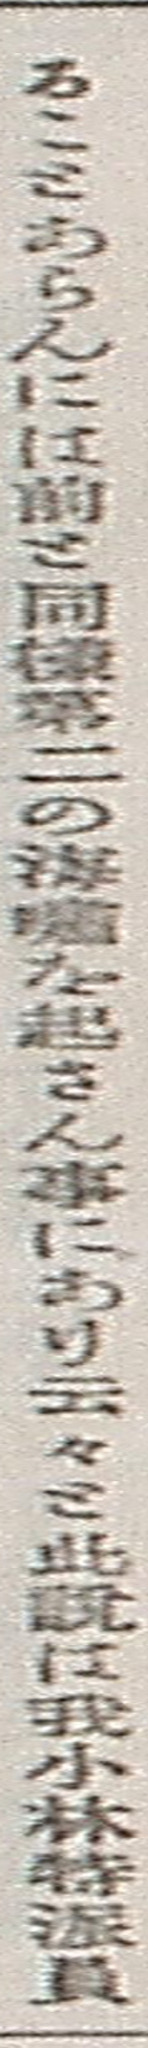ることあらんには前と同様第二の海嘯を起さん事にあり云々と此説は我小林特派員
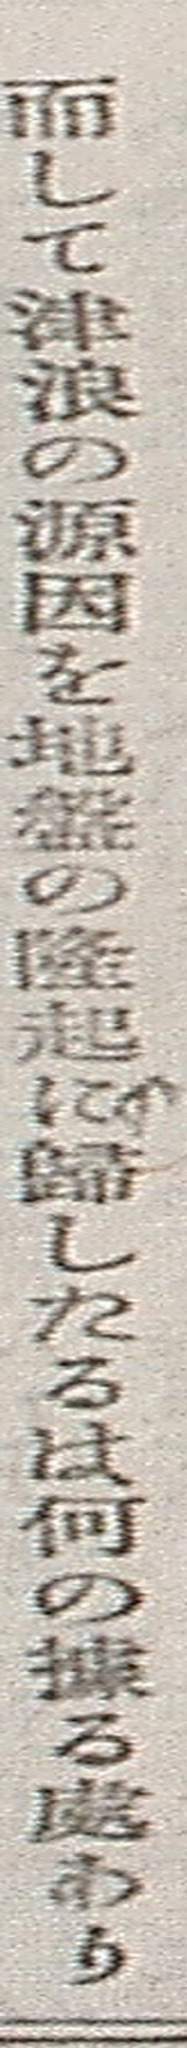而して津浪の源因を地盤の隆起に帰したるは何の拠る処あり
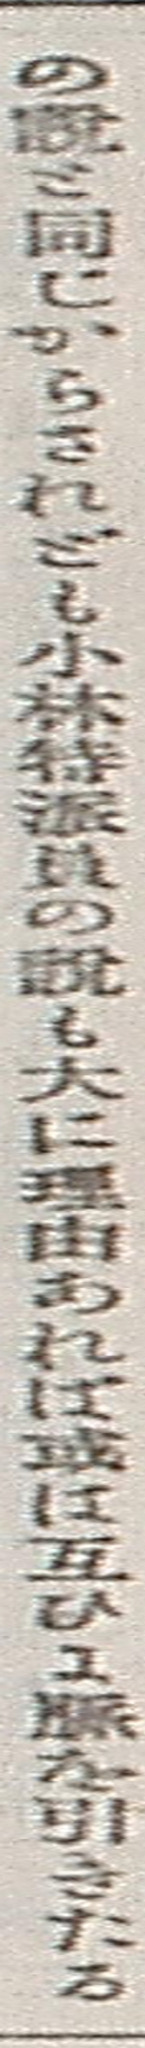の説と同じからざれども小林特派員の説も大に理由あれば或は互ひに脈を引きたる
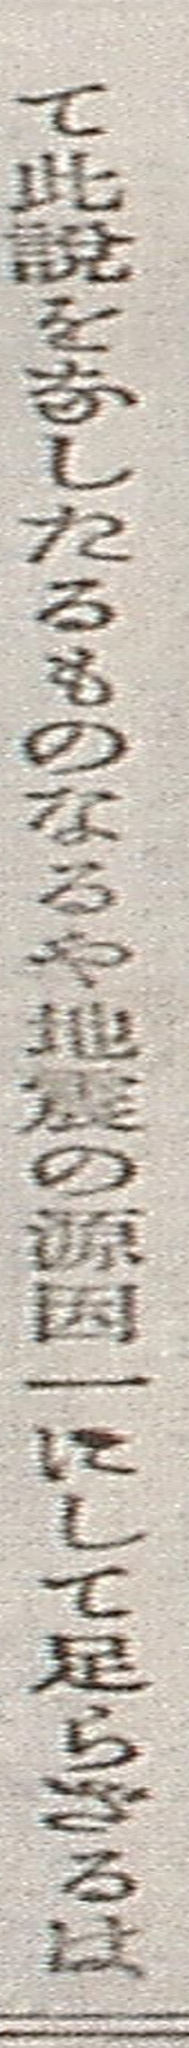て此説をなしたるものなるや地震の源因一にして足らざるは
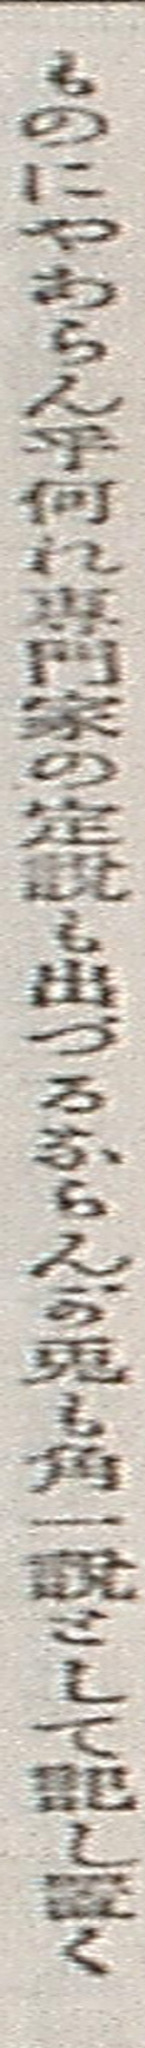ものにやあらん乎何れ専門家の定説も出づるならんが兎も角一説として記し置く
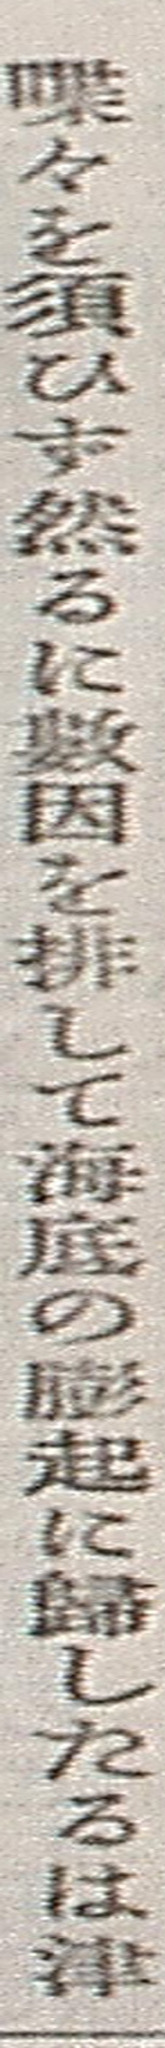喋々を須ひず然るに数因を排して海底の膨起に帰したるは津
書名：風俗畫報臨時増刊第百十九號　大海嘯被害録（中）
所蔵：東京大学地震研究所図書室 Earthquake Research Institute Library, The University of Tokyo, JAPAN
